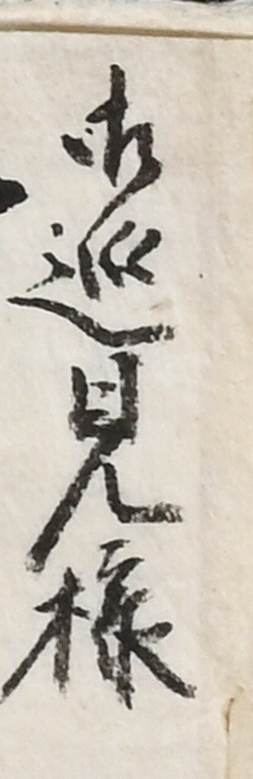御巡見様
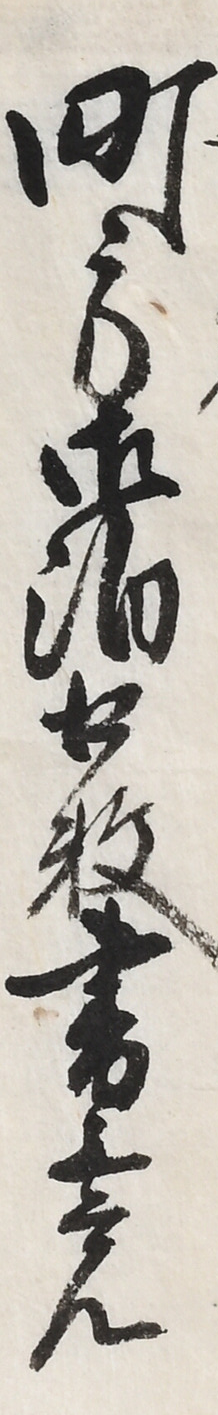町方御泊相数書上覚
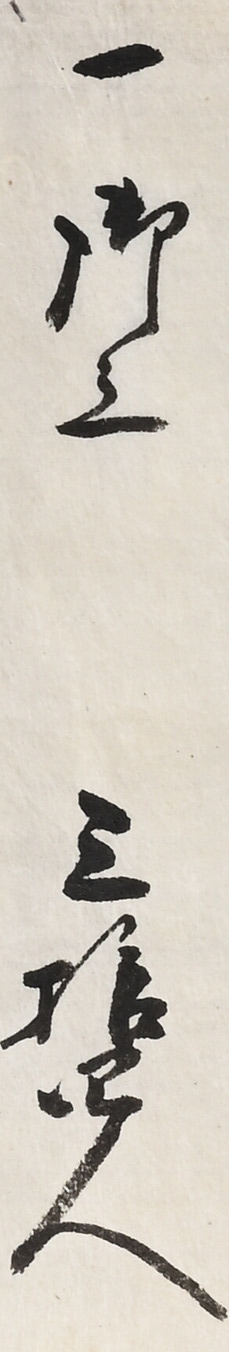一御上三拾四人
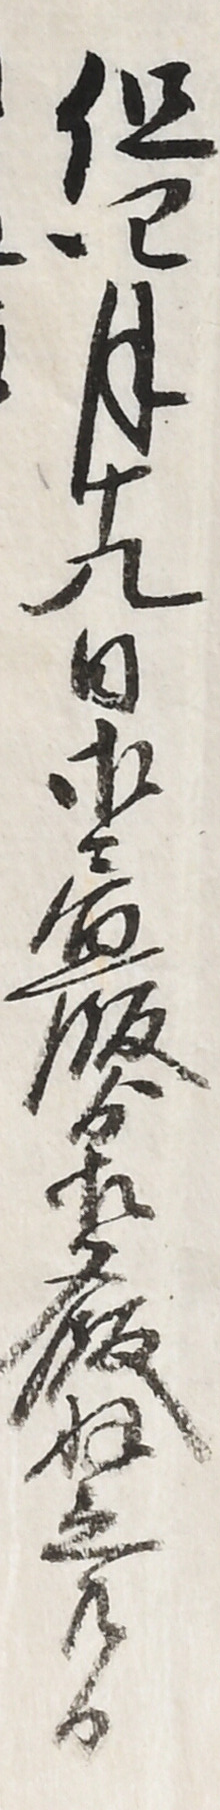但四月十九日御昼飯ゟ御夕飯翌廿日
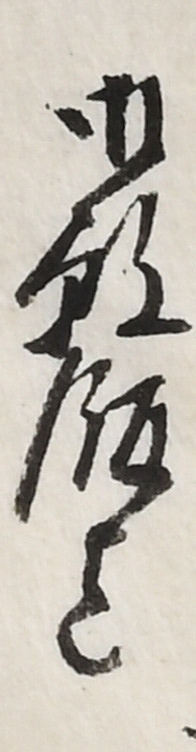御朝飯迄
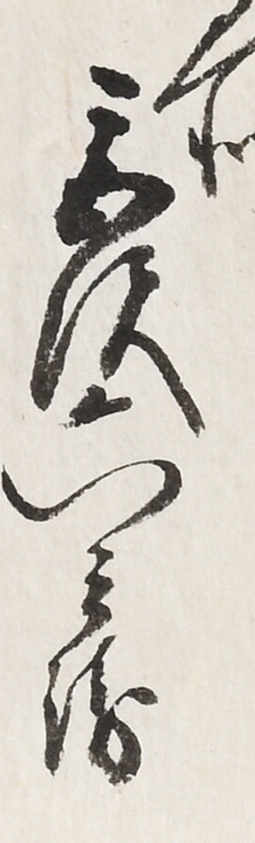宮沢六兵衛
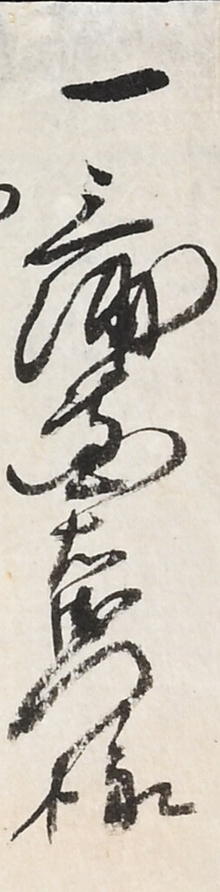一三浦団右衛門様
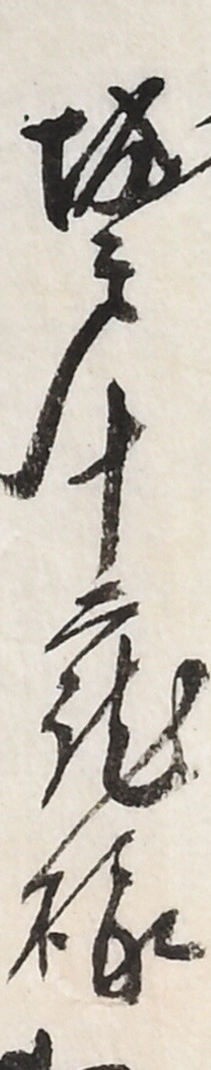城戸十蔵様
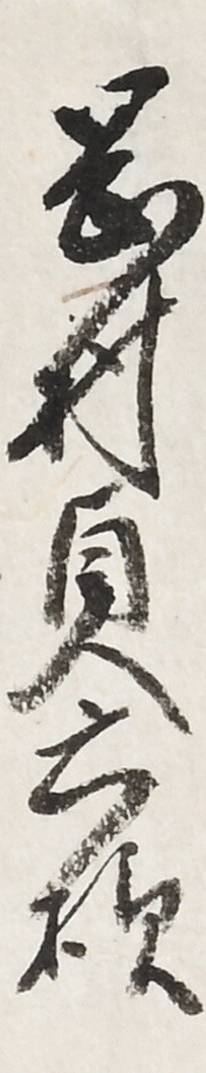岡村貞六様
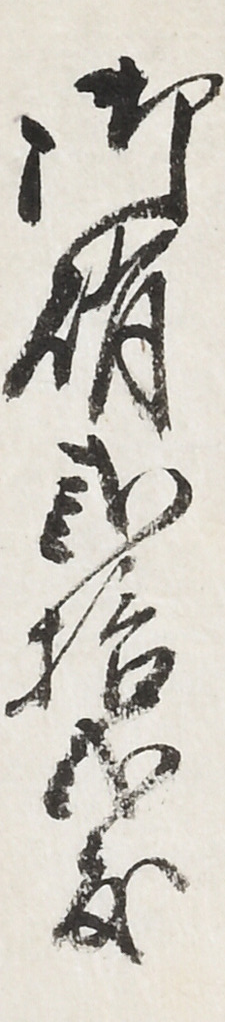御賄弐拾弐度
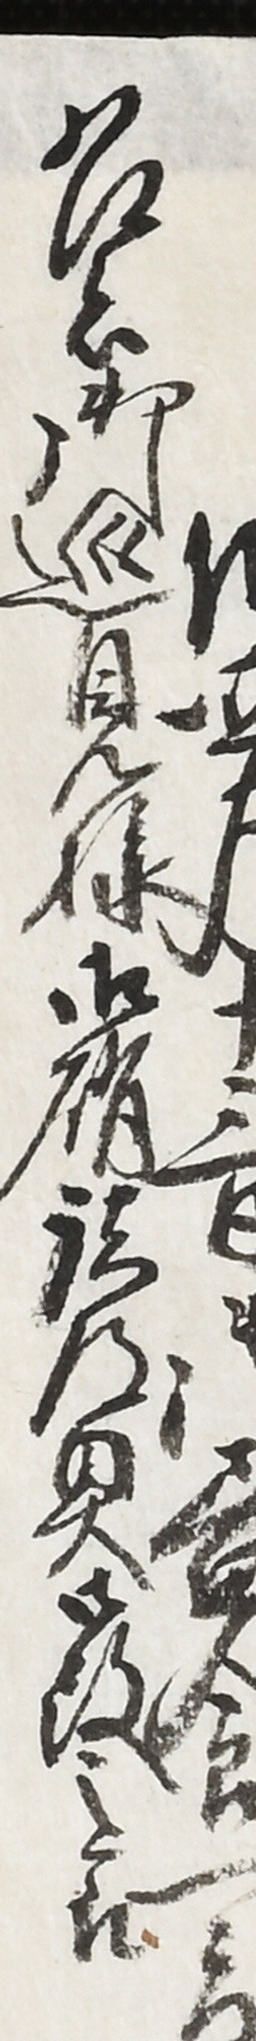右は御巡見様御賄諸道具御改之節
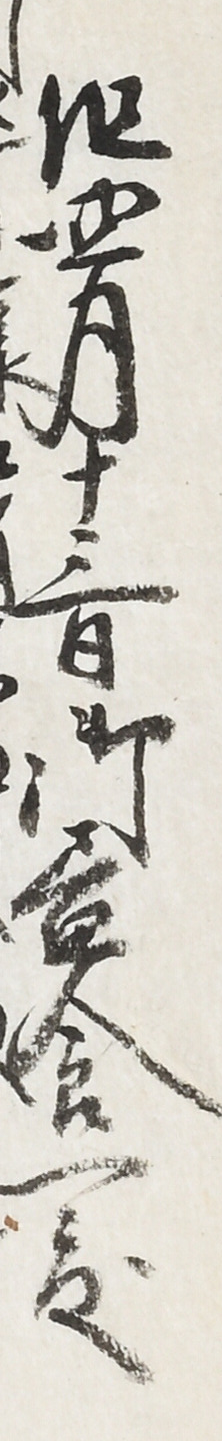但四月十三日御昼食一度
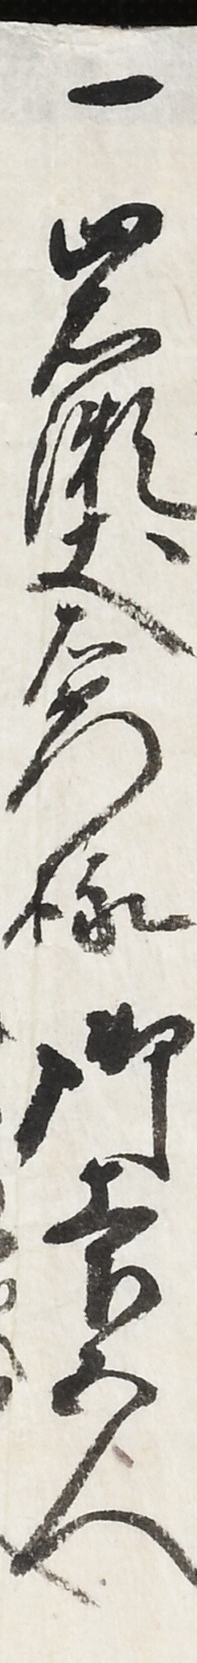一岩瀬丈右衛門様御上下五人
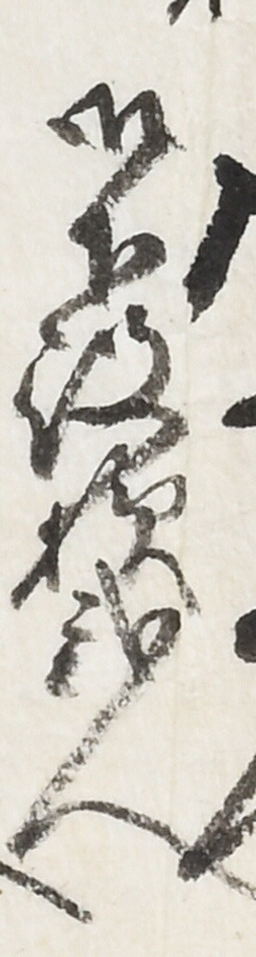御下役様弐人
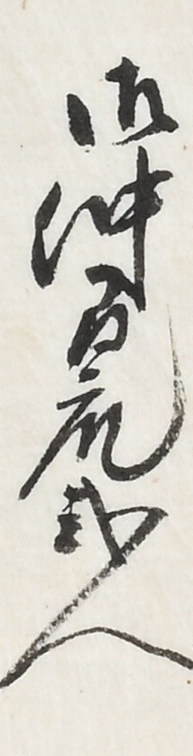御仲間衆弐人
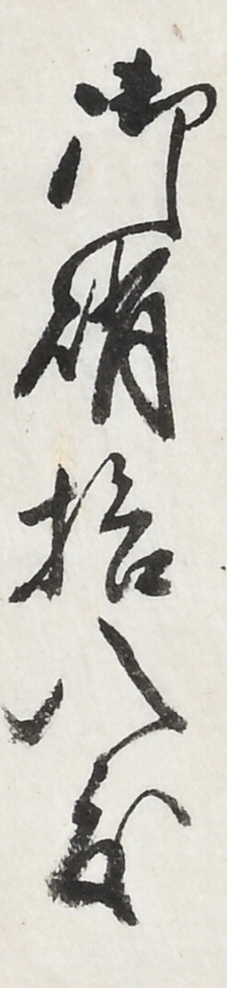御賄拾八度
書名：御巡見様町方御泊相数書上覚
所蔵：伊那市立高遠町図書館・合同会社AMANE
